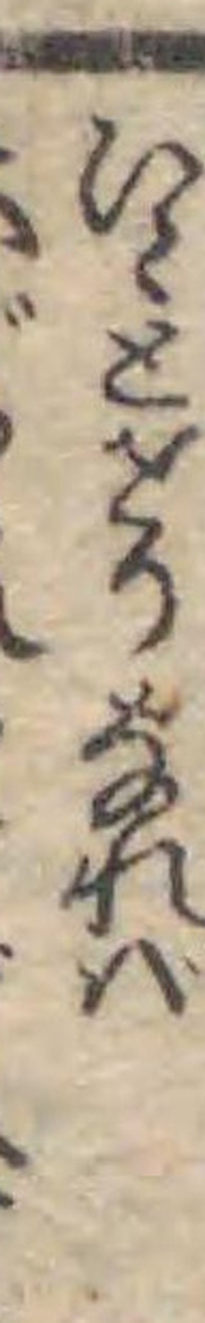ひととをりなれば
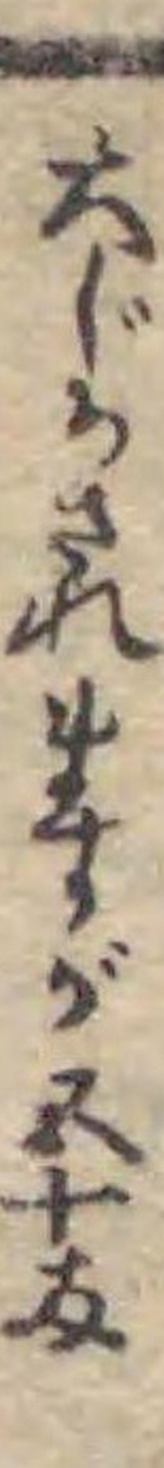大じかされますが五十両
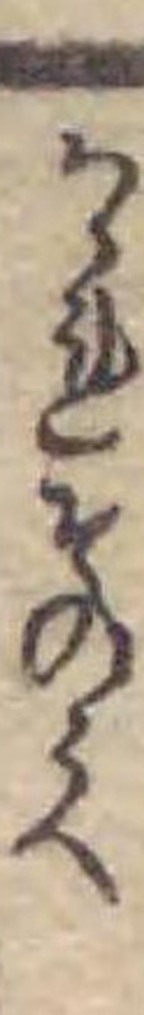かゝれそのうへ
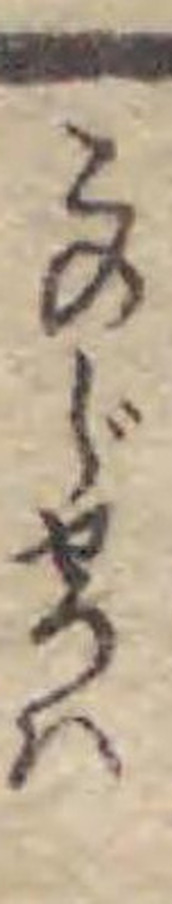このじせつは
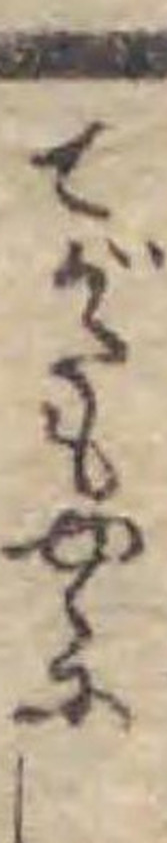てがたもやくに
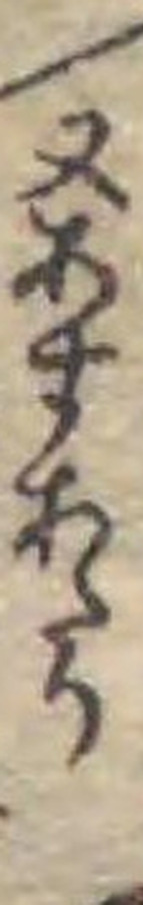又あすあたり
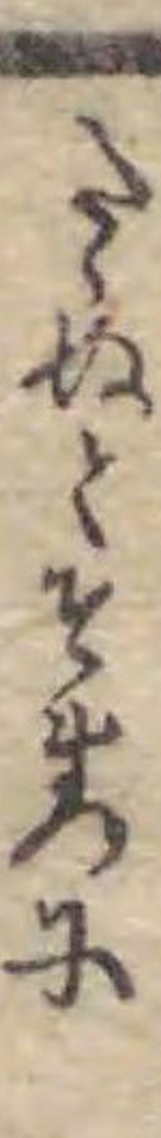たゝぬとそまつに
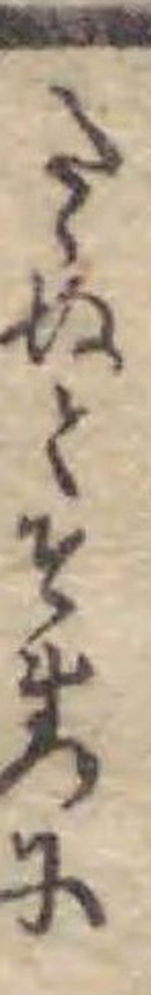たゝぬとそまつに
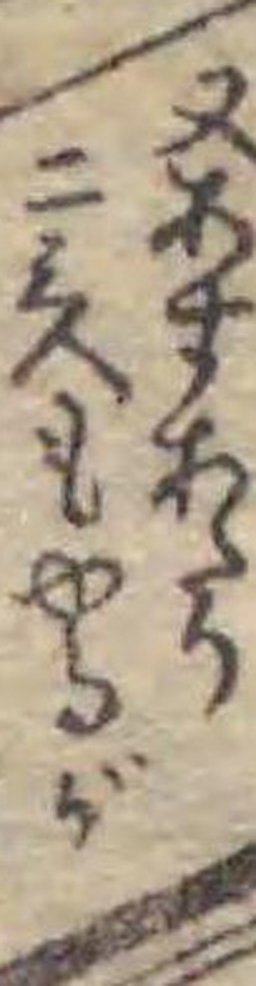二三人もやるが
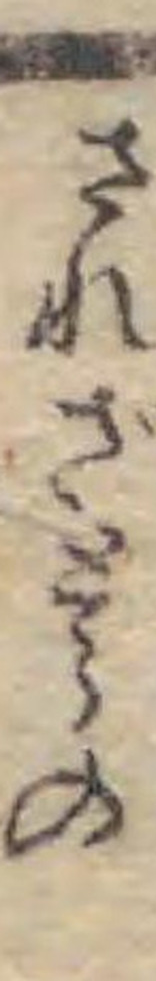されざとうの
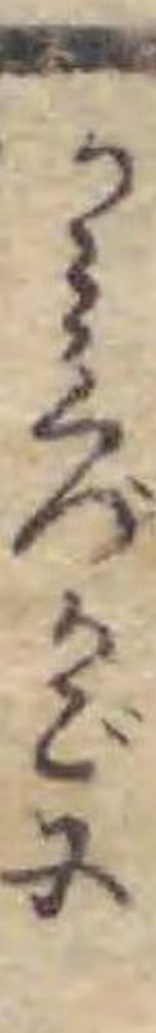かみくづかごに
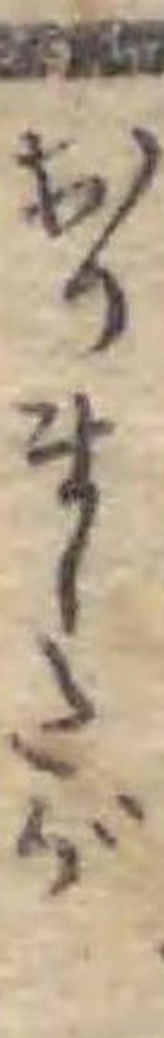おりましたが
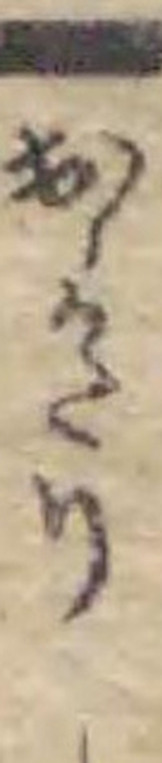おゝかたり
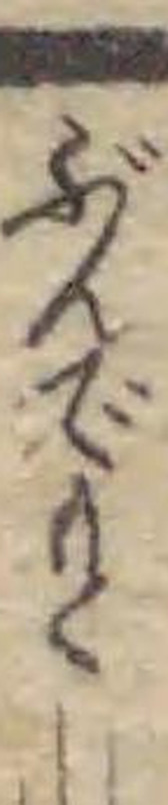ぶんでもと
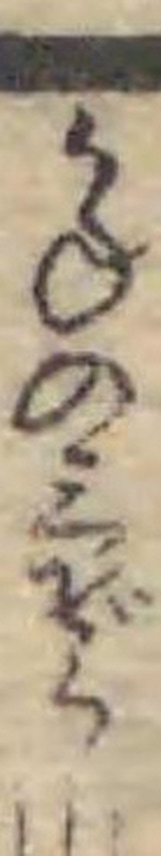かねの三ぞう
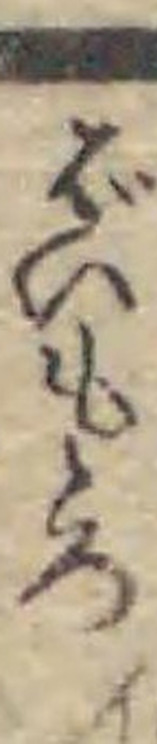ばいもとつ
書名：紙屑身上噺 : 3巻
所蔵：国立国会図書館 National Diet Library, JAPAN
